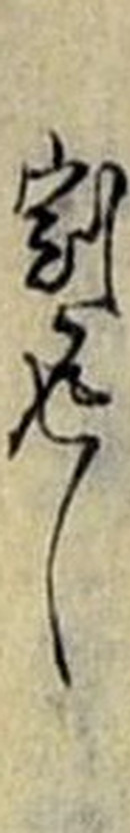割返し
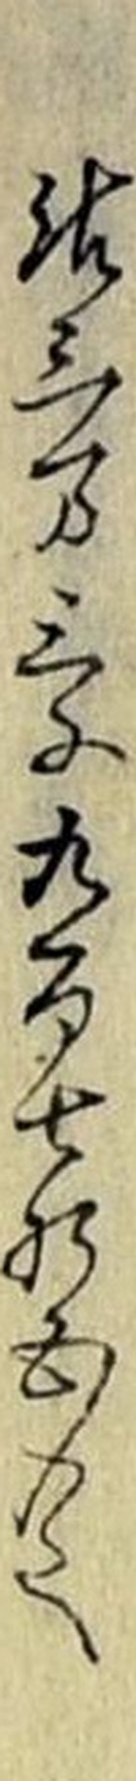銀三万三千九百七拾五貫匁
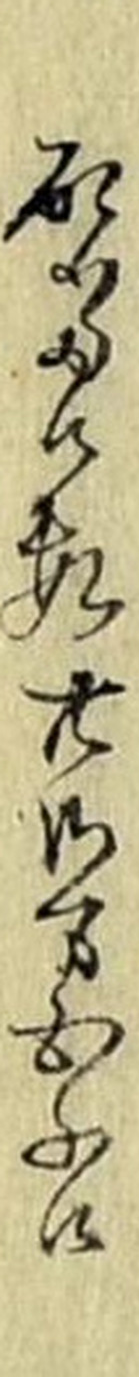配当口数廿弐万五千口
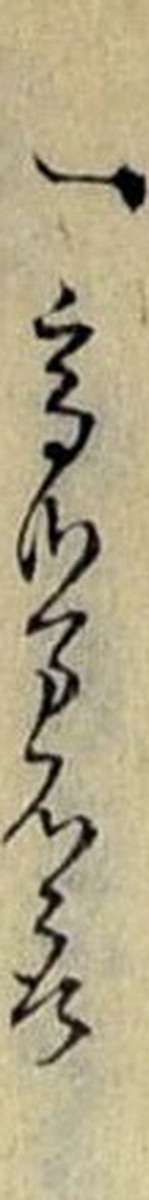一高弐万石取
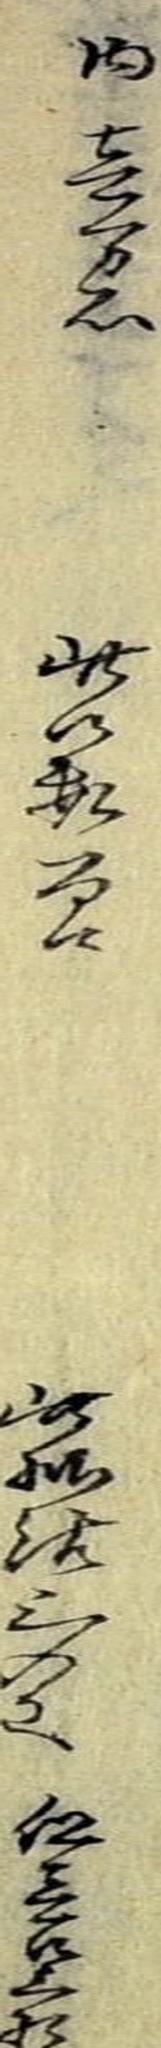内壱万石此口数百口此掛銀三貫匁但壱口三拾匁掛
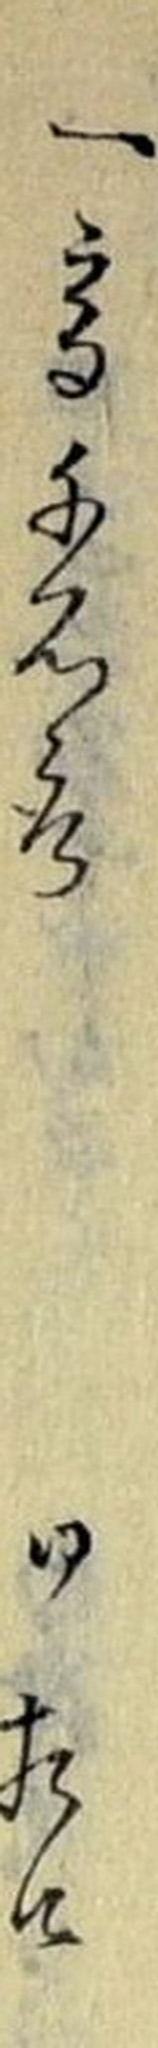一高千石取同拾口
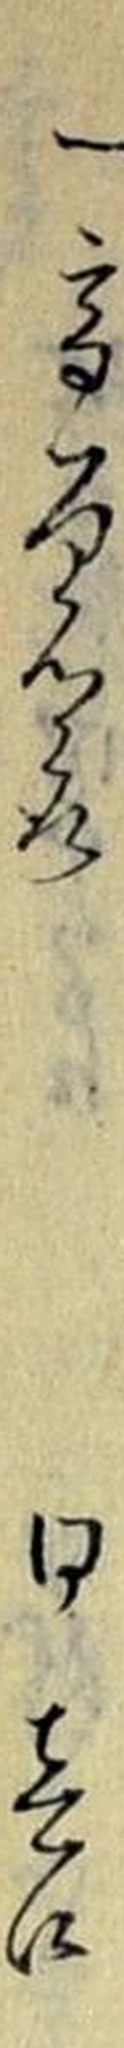一高百石取同壱口
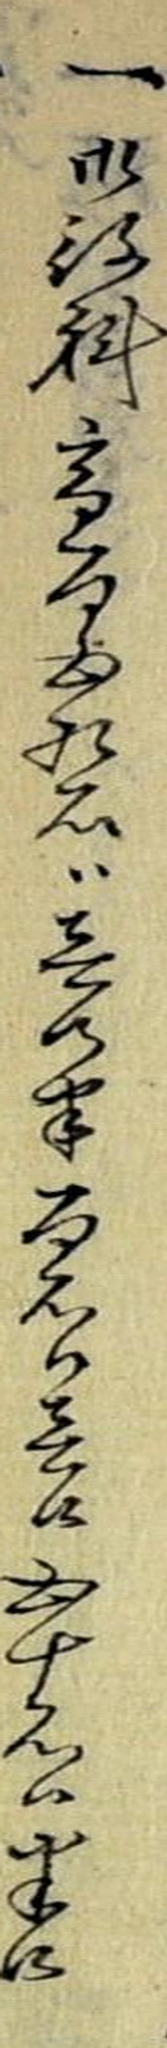一御役料高百五拾石は壱口半百石は壱口五十石は半口
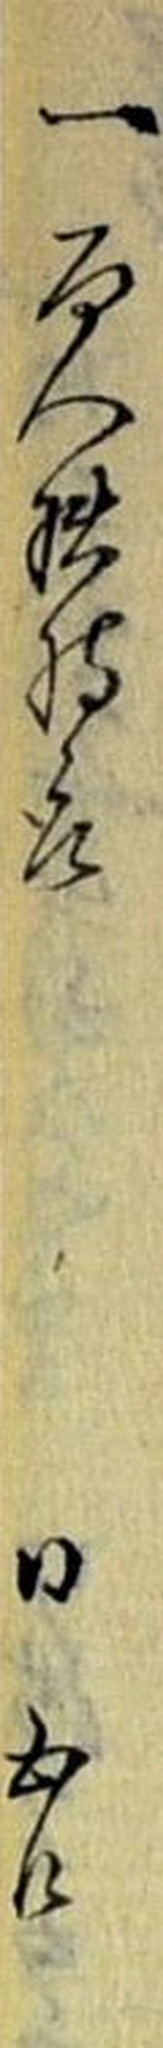一百人扶持取同五口
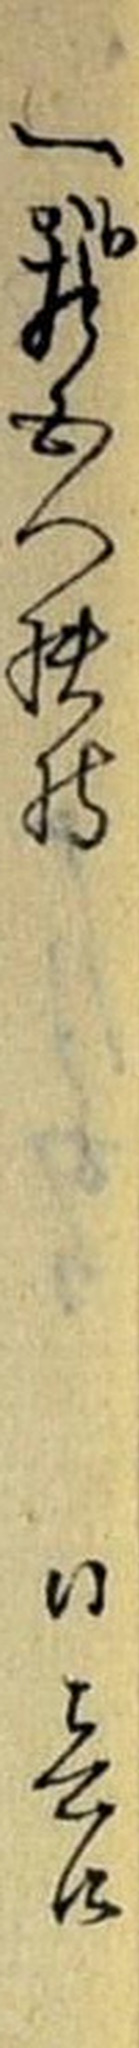一弐拾五人扶持同壱口
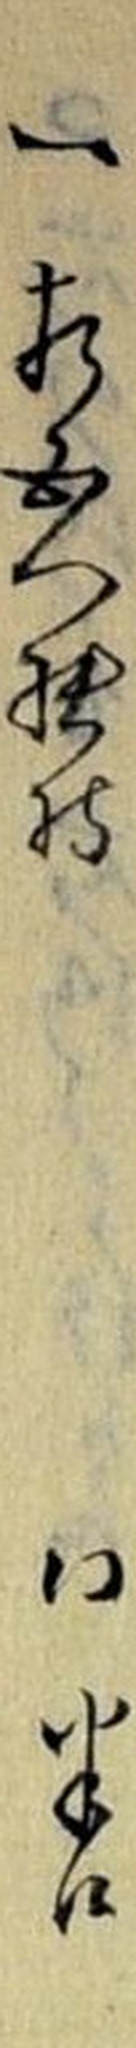一拾五人扶持同半口
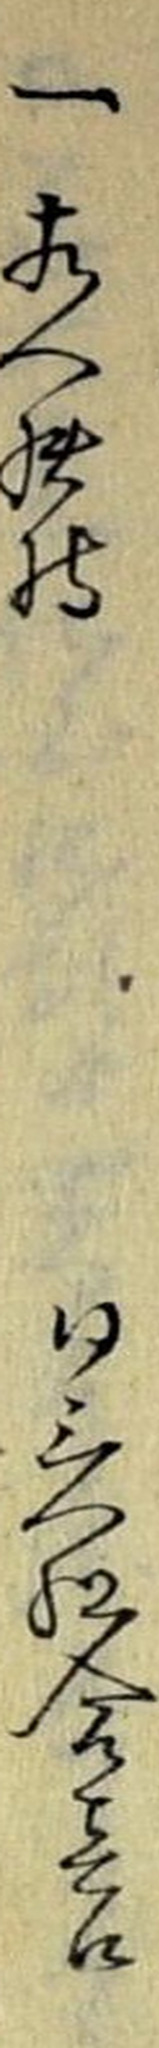一拾人扶持同三人組合壱口
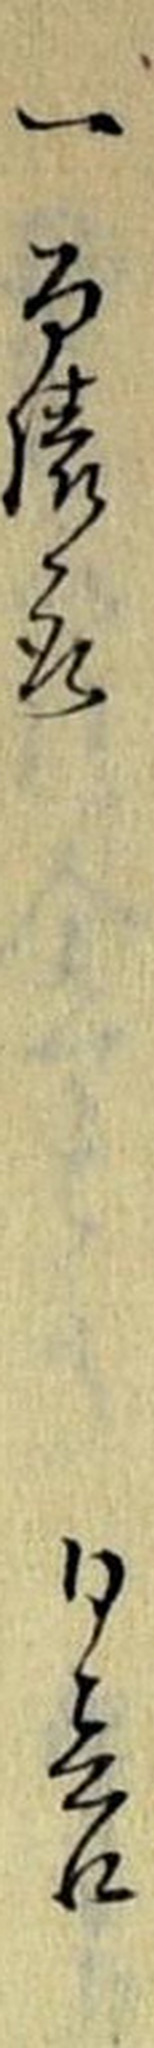一百俵取同一口
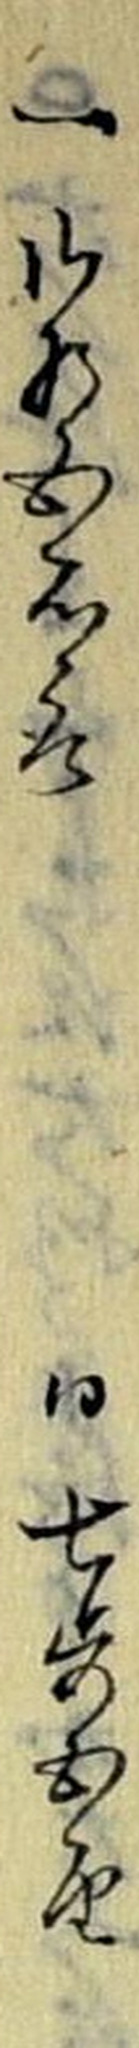一弐拾五石取同七歩五厘
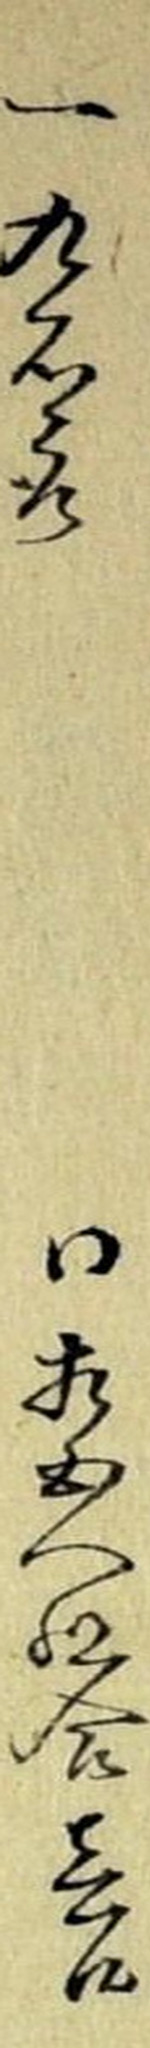一九石取同拾五人組合壱口
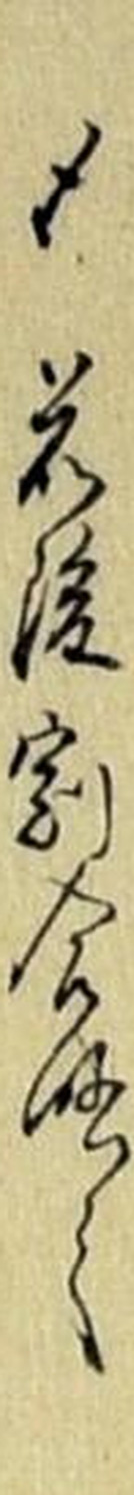〆前後割合略之
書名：命令之部 六
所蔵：福井県文書館 Fukui Prefectural Archives
